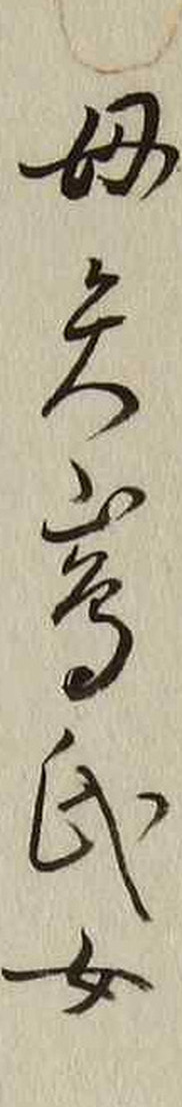母矢嶋氏女
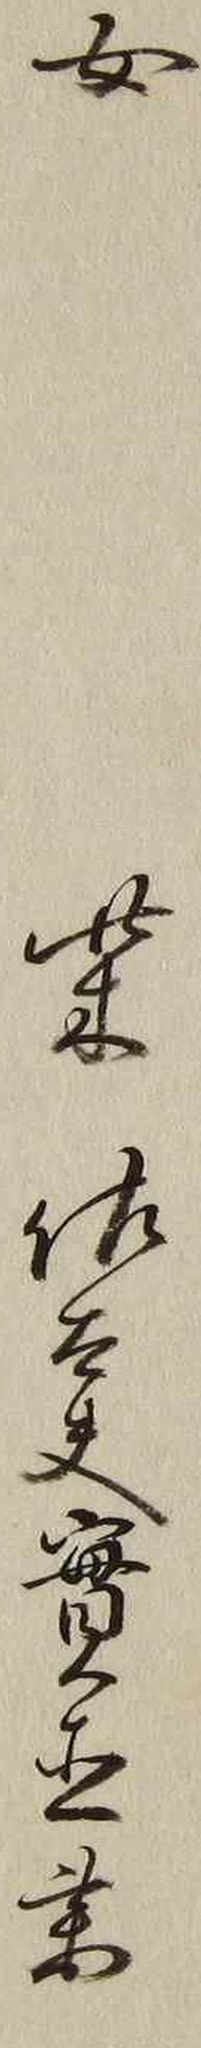女柴佐太夫實直妻
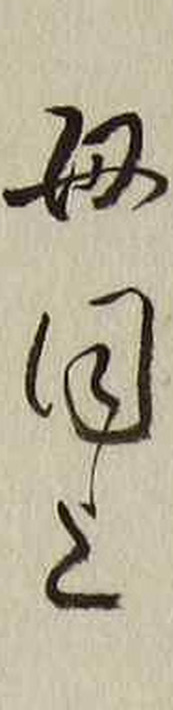母同上
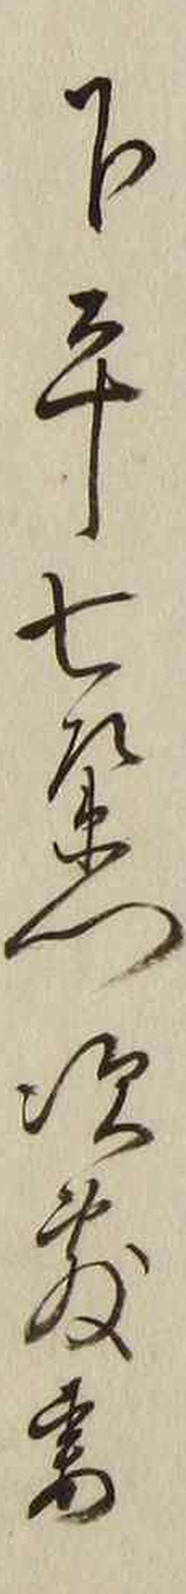女下平七左衛門次敷妻

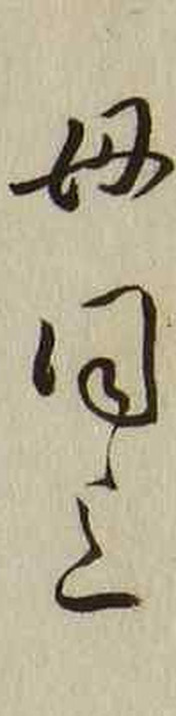母同上
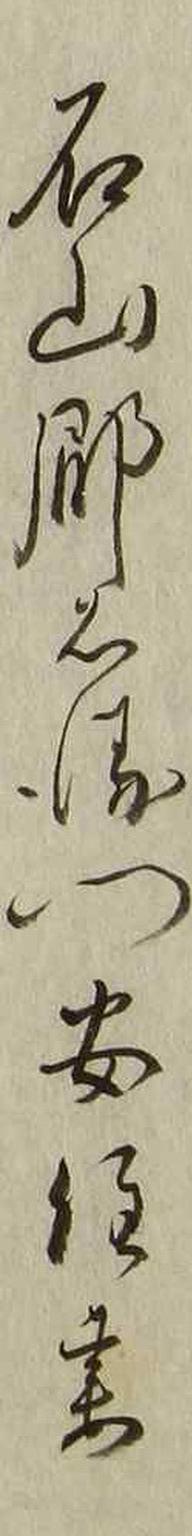女石山郷右衛門安住妻
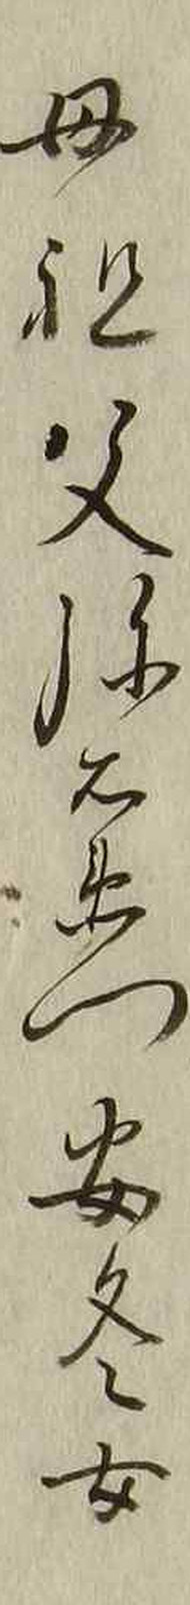母祖父弥右衛門安冬女
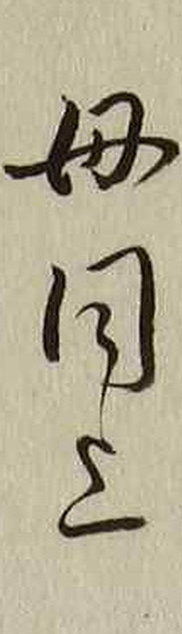母同上
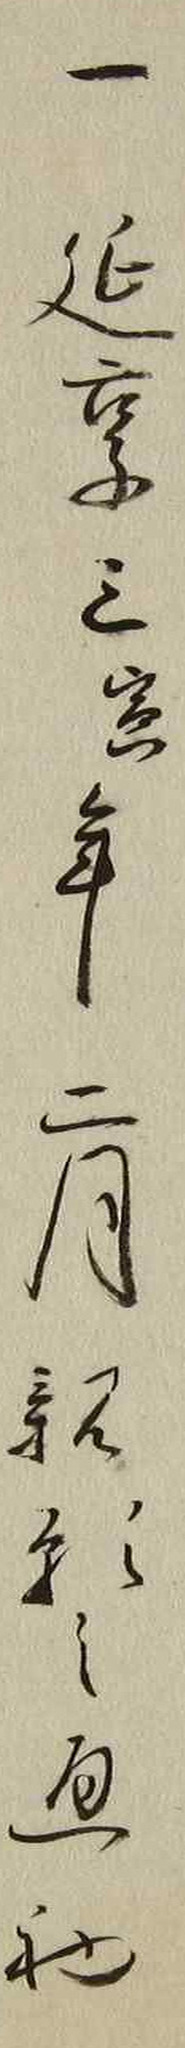一延享三寅年二月親願之通初
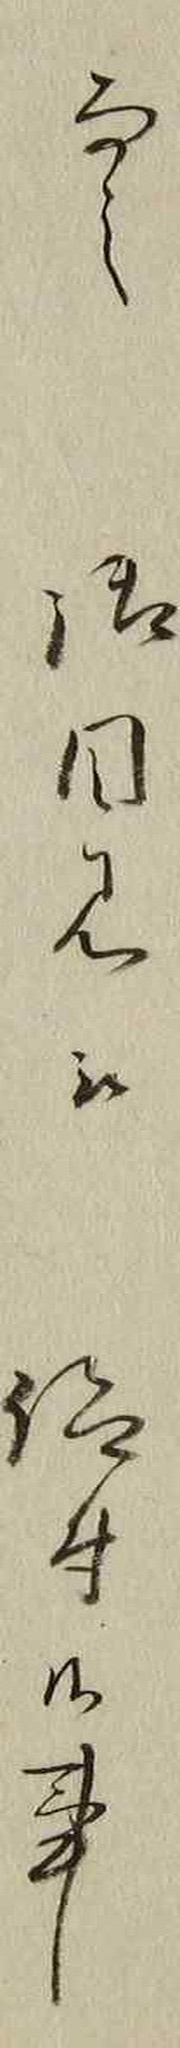而之御目見被仰付候事
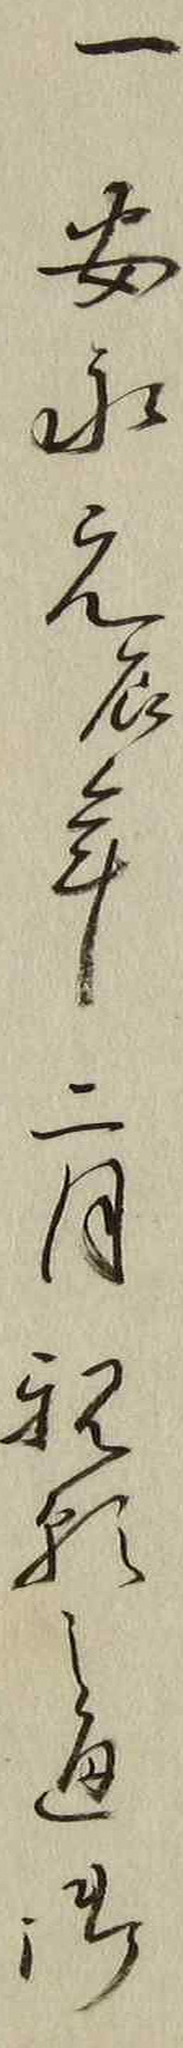一安永元辰年二月親願之通御
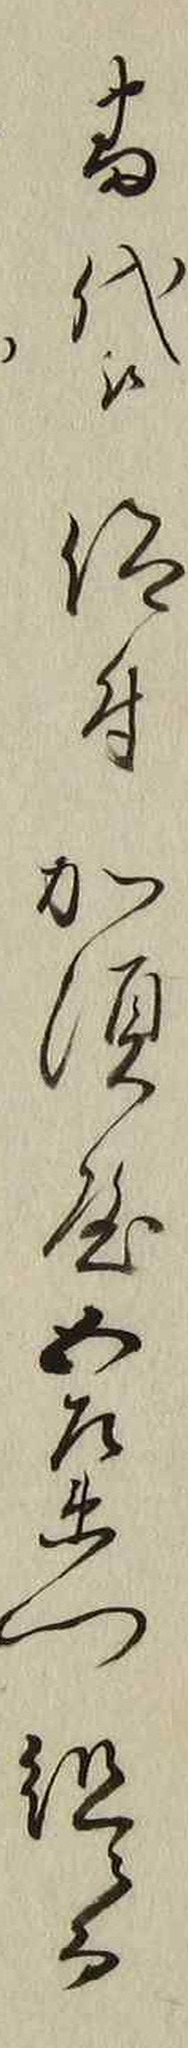番代被仰付加須屋五左衛門組に而
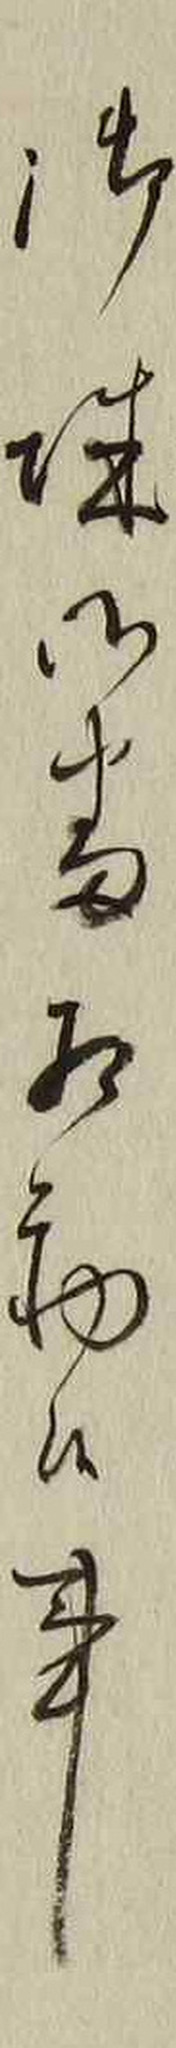御城御番相勤候事
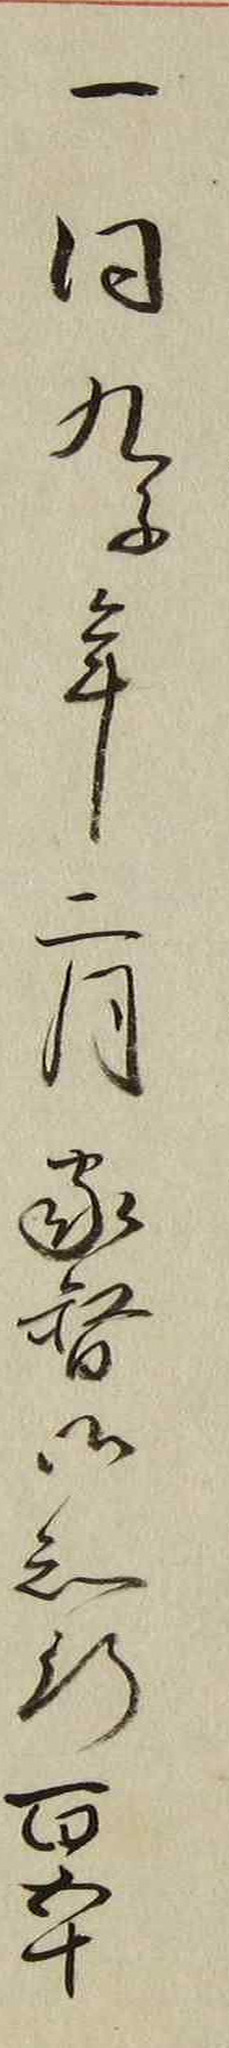一同九子年二月家督御知行百五十
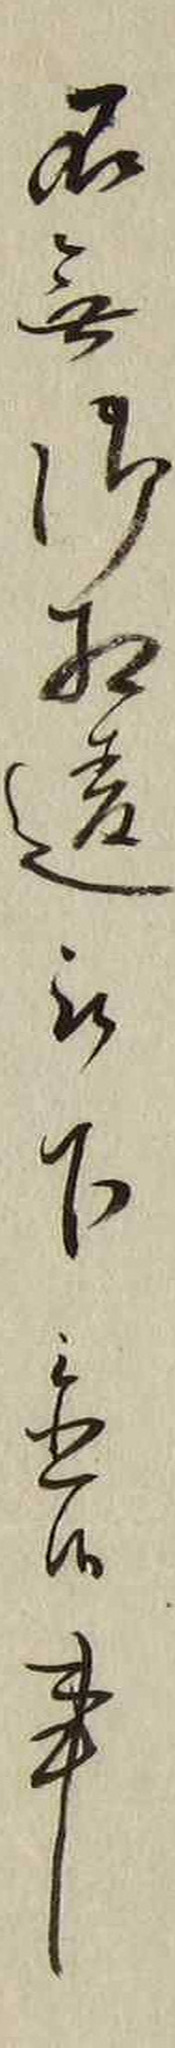石無御相違被下置候事
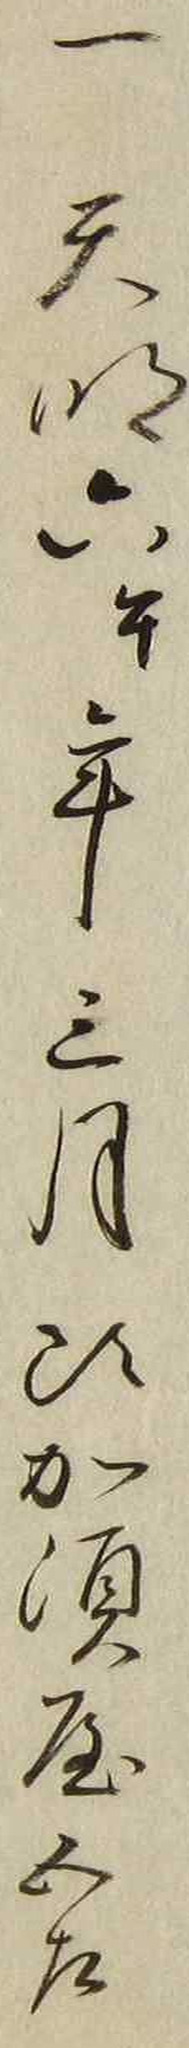一天明六午年三月頭加須屋五左
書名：諸士系譜　巻之6　い之部6
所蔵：会津若松市立会津図書館
